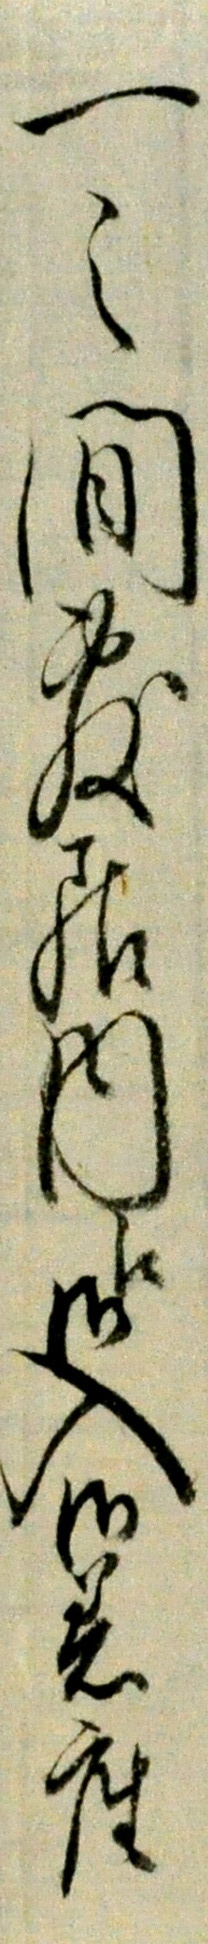一之間敷居内え御入御着座
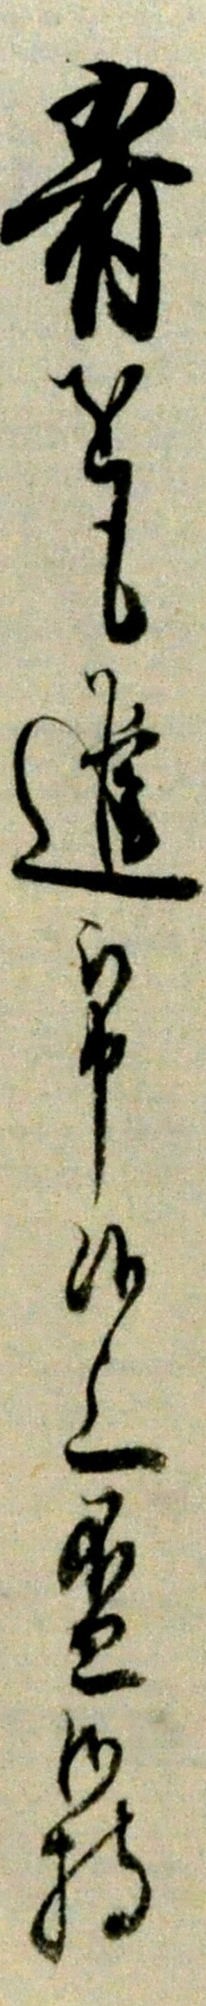肴をも進被申候上盃御持

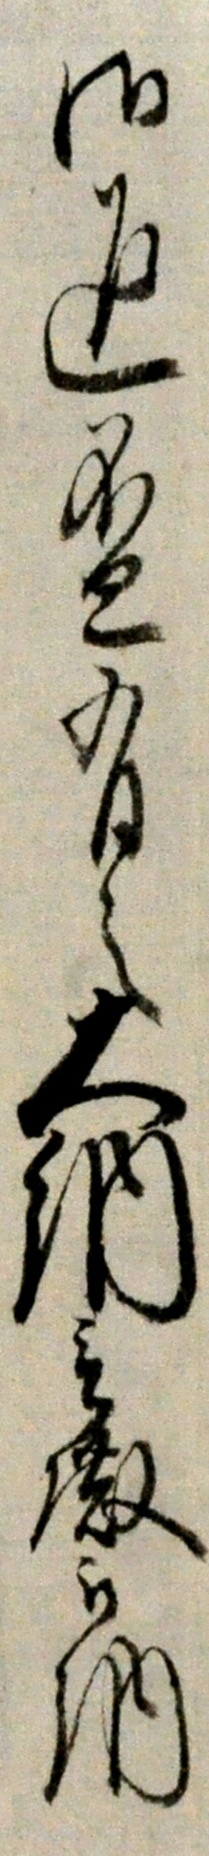御返盃有之大納言殿え納
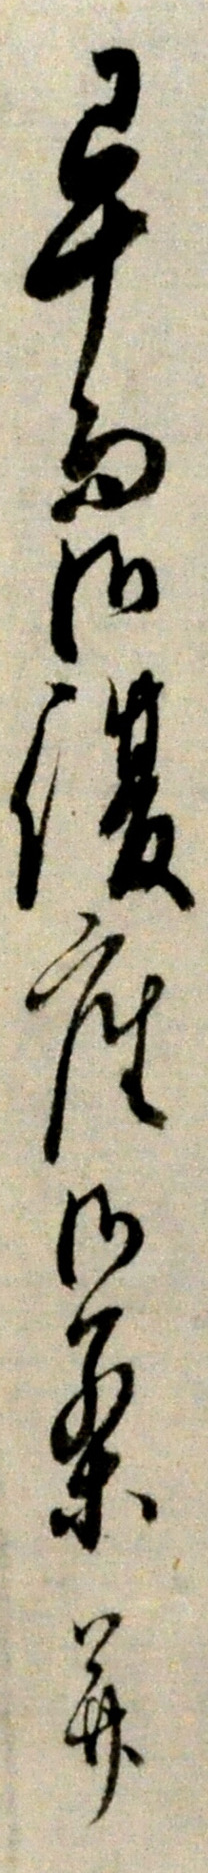畢而御復座御茶并
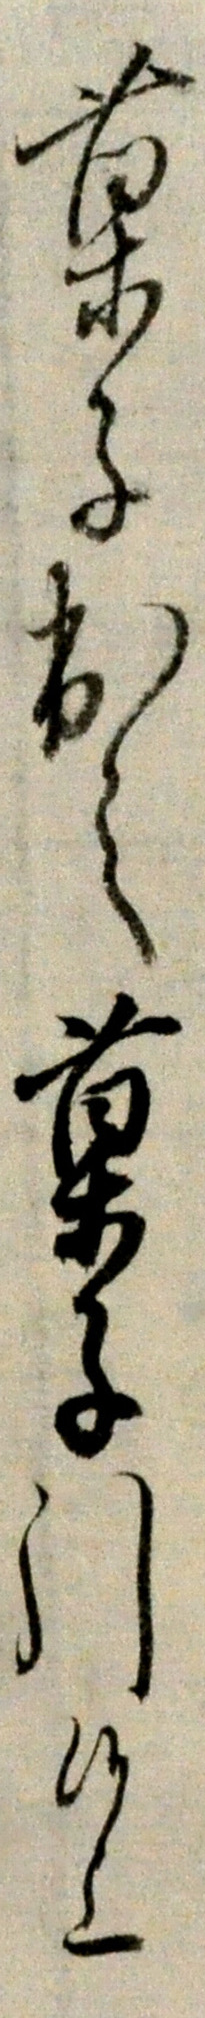菓子出之菓子引候上
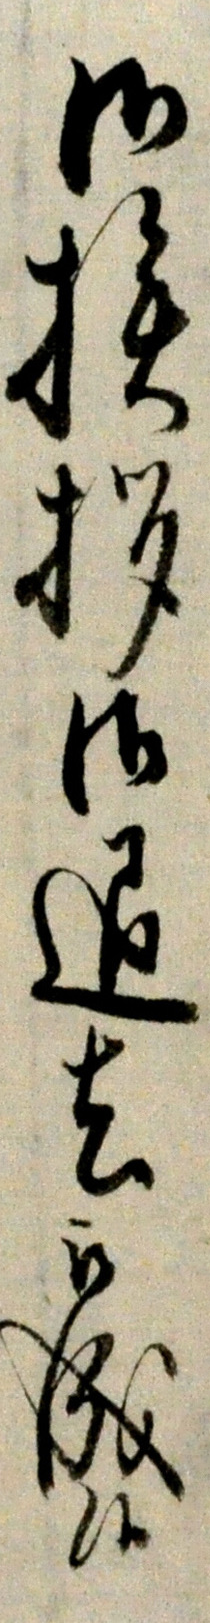御挨拶御退去被成候
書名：諸留書〔一括〕
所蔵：伊那市立高遠町図書館・合同会社AMANE
